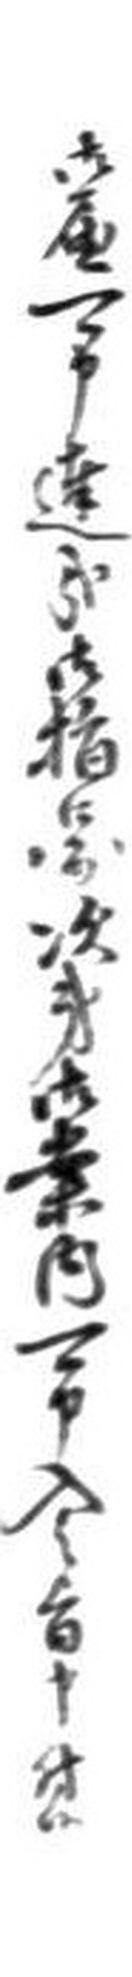御届可申達哉御指図次第御案内可申入与旨申付候
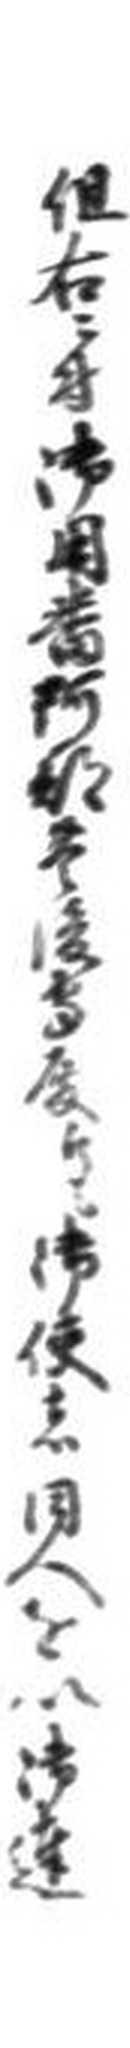但右ニ付御用番阿部豊後守殿江も御使者同人を以御達

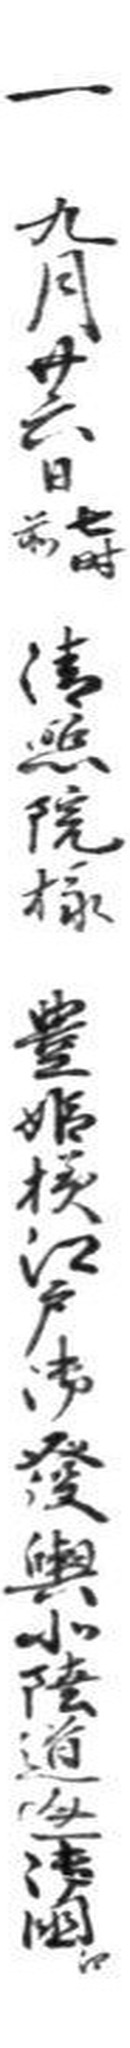一九月廿六日七時前清照院様豊姫様江戸御発輿北陸道通帰国江
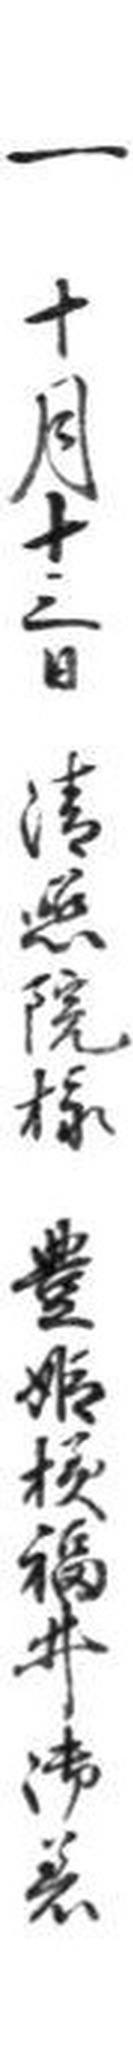一十月十三日清照院様豊姫様福井御着
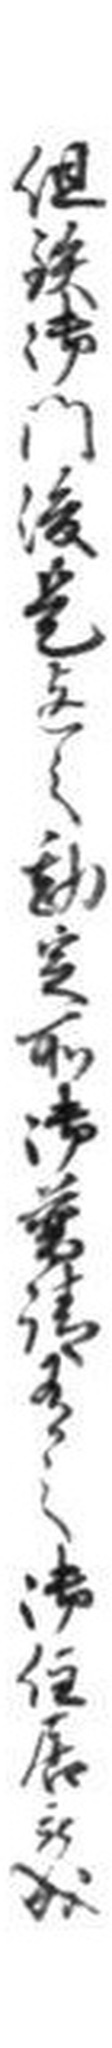但鉄御門後是迄之勘定所御普請有之御住居被成
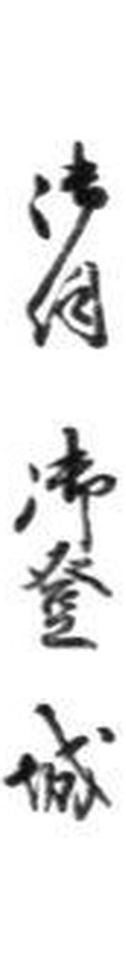御伺御登城
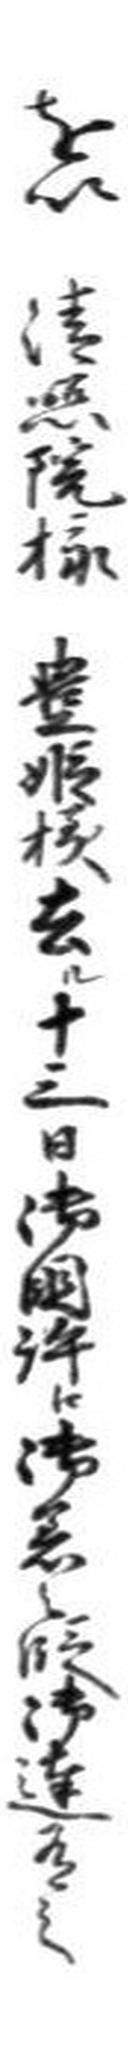を以清照院様豊姫様去ル十三日御国許江御着之段御達有之
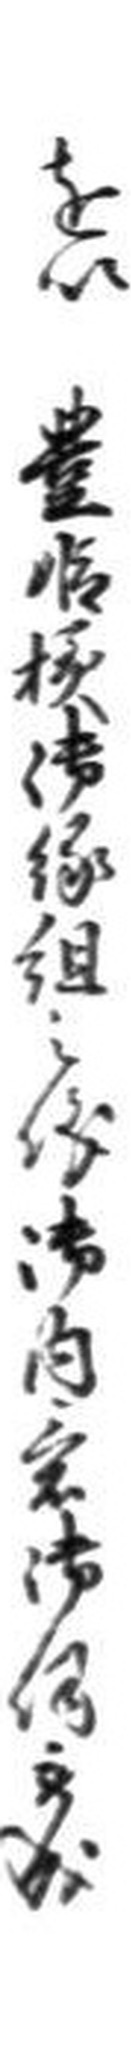を以豊姫様御縁組之儀御内意御伺被成
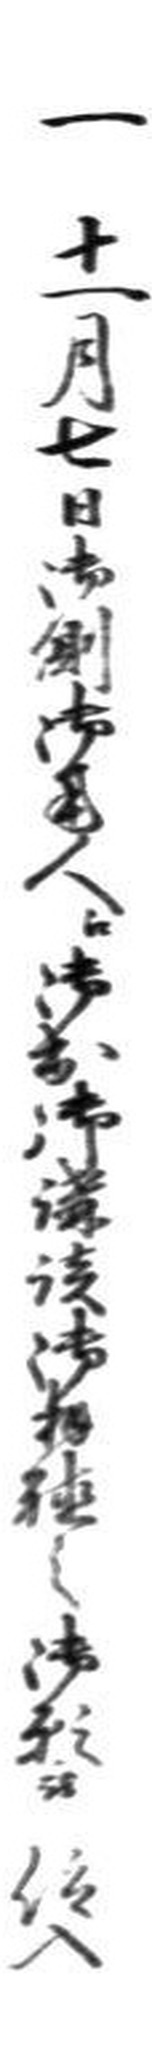一十一月七日御側御用人江御出御講談御拝聴之御願被仰入
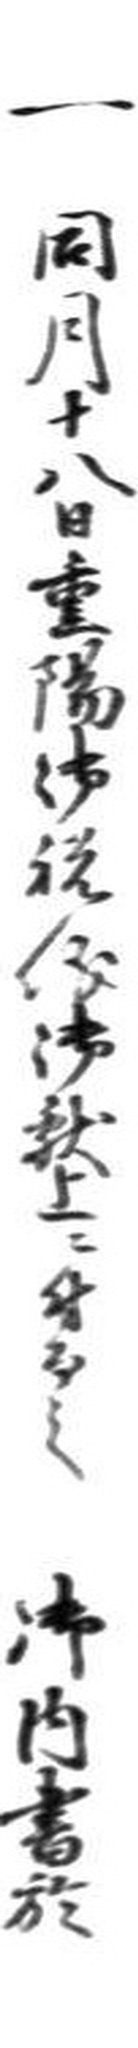一同月十八日重陽御祝儀御献上ニ付而之御内書於
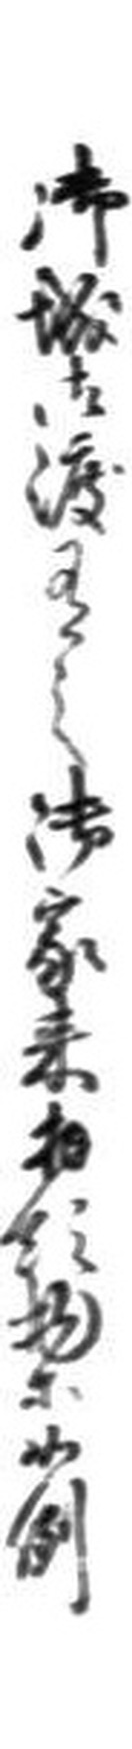御城御渡有之御家来拝領物等如例
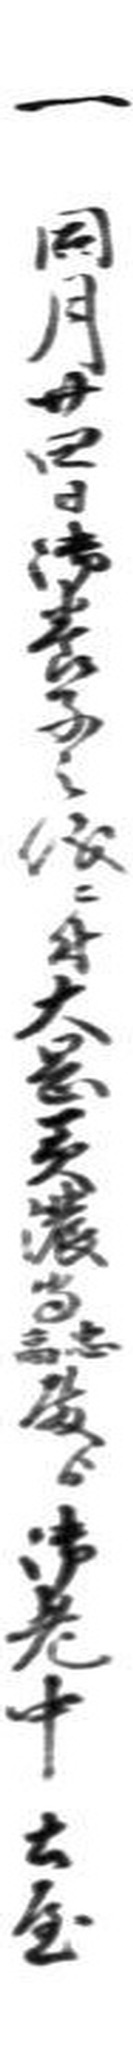一同月廿四日御養子之儀ニ付大岡美濃守忠高殿ゟ御老中土屋
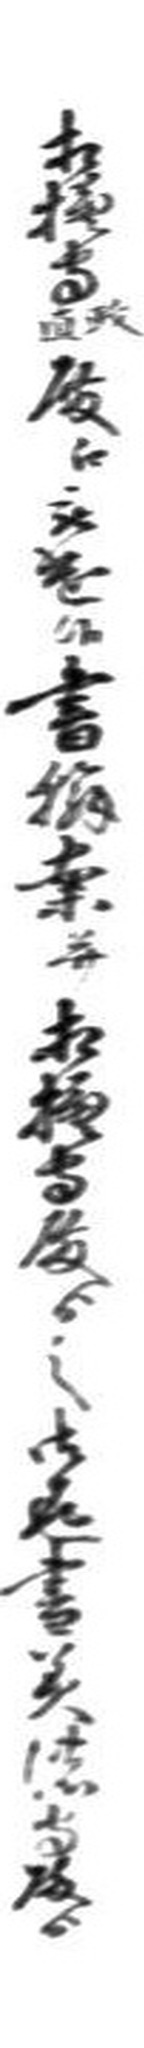相模守政直殿江被遣候書翰案并相模守殿ゟ之御返書美濃守殿ゟ
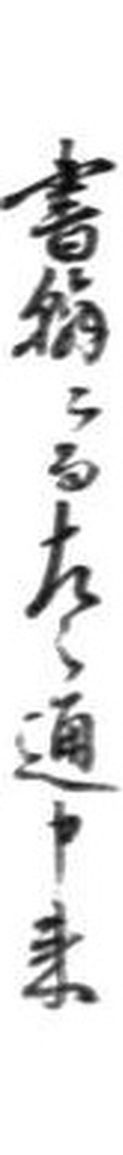書翰ニ而左之通申来
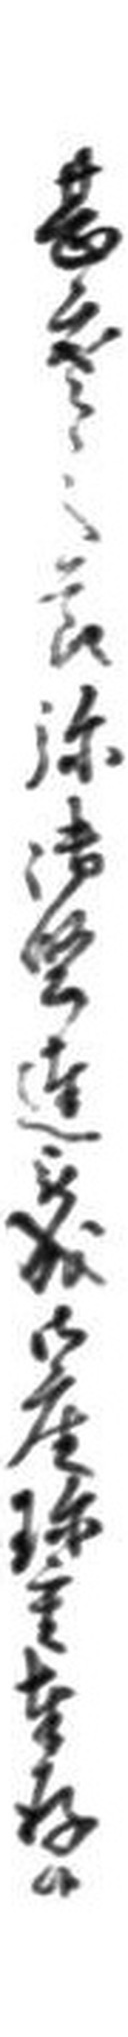甚寒之節弥御堅達被成御座珍重奉存候

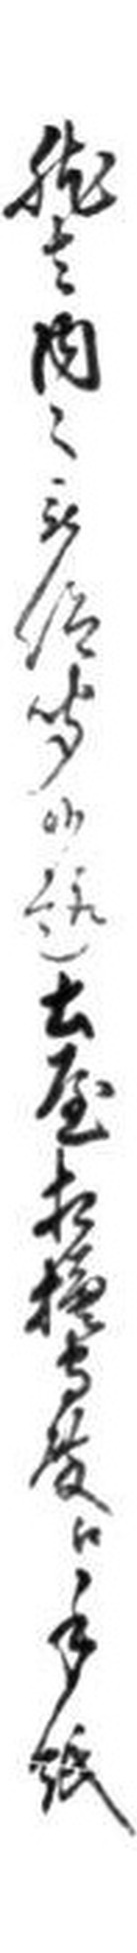然者内々被仰聞候趣土屋相模守殿江手紙
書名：家譜 二十一 吉品公 従元禄十三年到同十四年
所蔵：福井県文書館 Fukui Prefectural Archives
